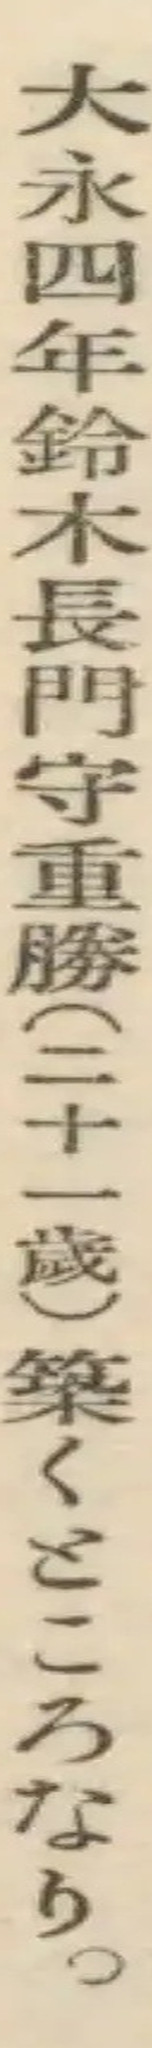大永四年鈴木長門守重勝(二十一歳)築くところなり。
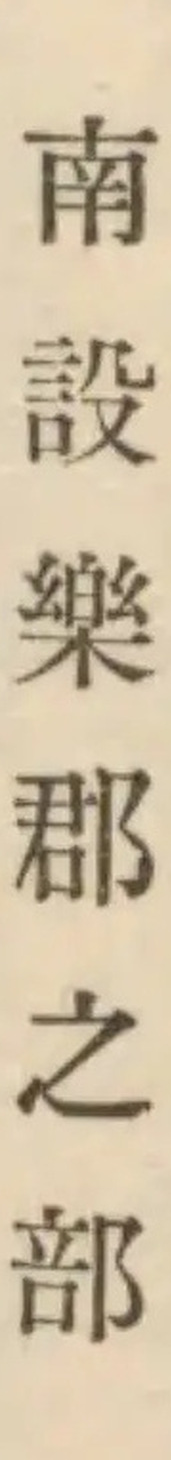南設楽郡之部
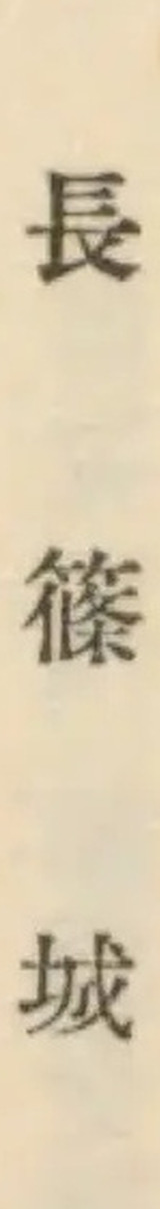長篠城
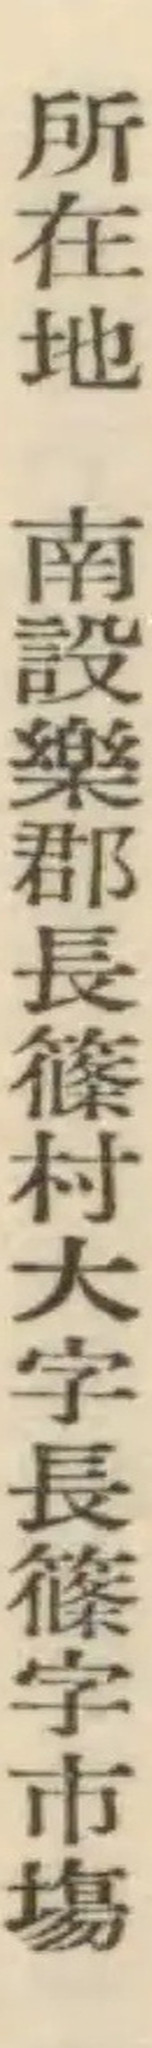所在地南設楽郡長篠村大字長篠字市場
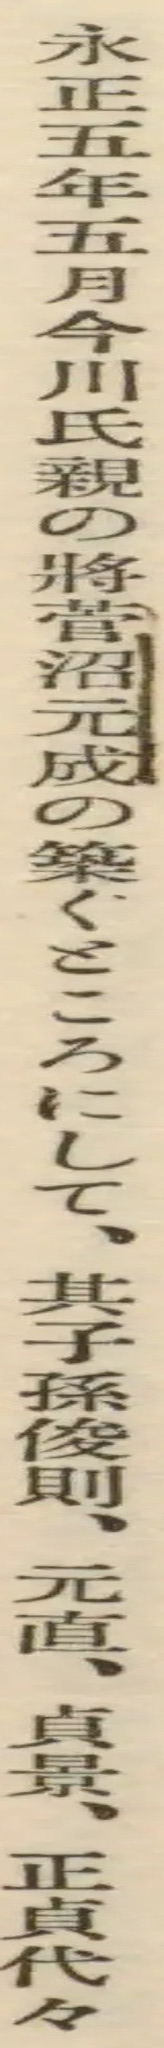永正五年五月今川氏親の将菅沼元成の築くところにして、其子孫俊則、元直、貞景、正貞代々
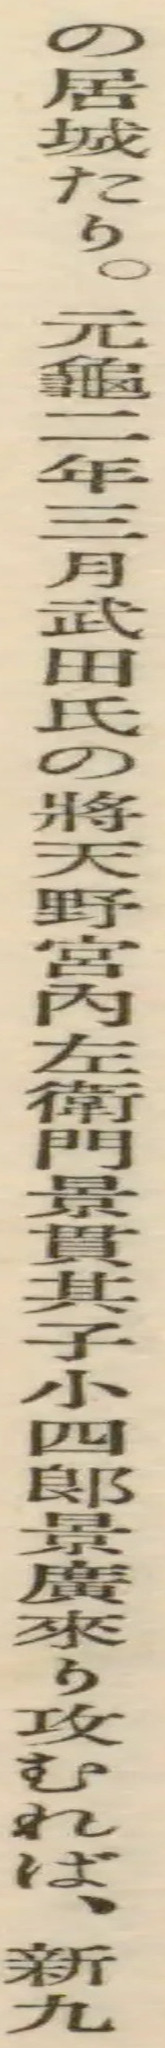の居城たり。元亀二年三月武田氏の将天野宮内左衛門景貫其子小四郎景広来り攻むれば、新九
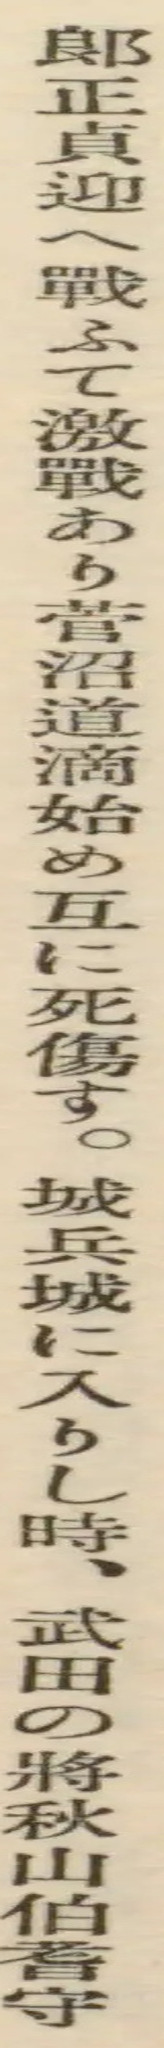郎正貞迎へ戦ふて激戦あり菅沼道滴始め互に死傷す。城兵城に入りし時、武田の将秋山伯耆守
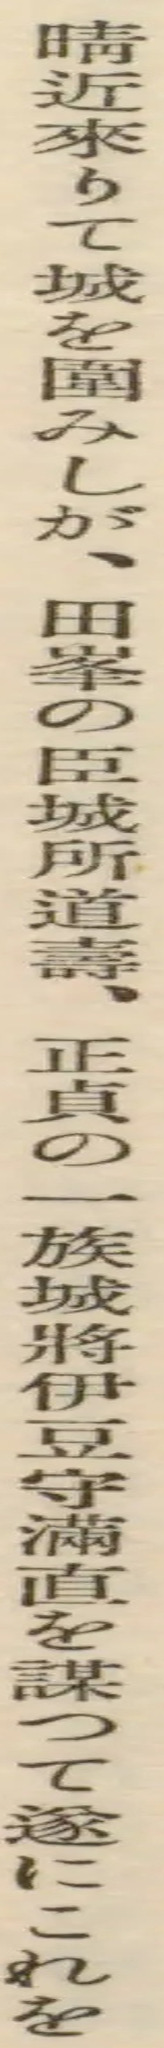晴近来りて城を囲みしが、田峯の臣城所道寿、正貞の一族城将伊豆守満直を謀つて遂にこれを
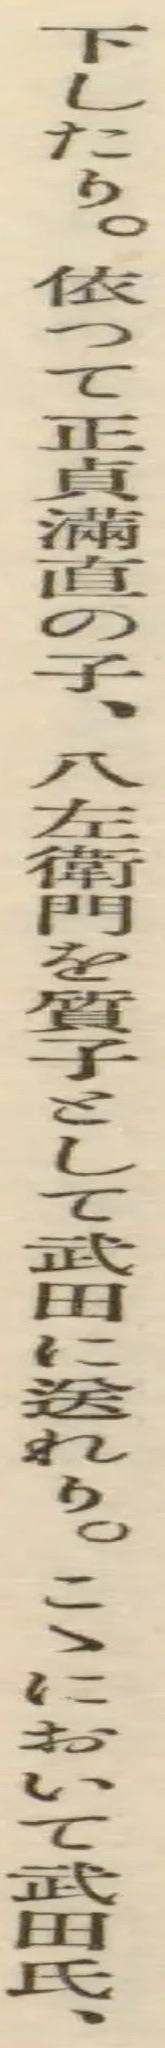下したり。依つて正貞満直の子、八左衛門を質子として武田に送れり。こゝにおいて武田氏、
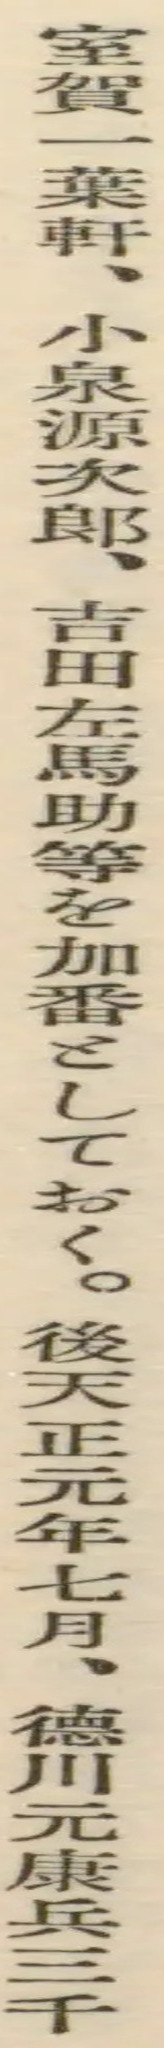室賀一葉軒、小泉源次郎、吉田左馬助等を加番としておく。後天正元年七月、徳川元康兵三千
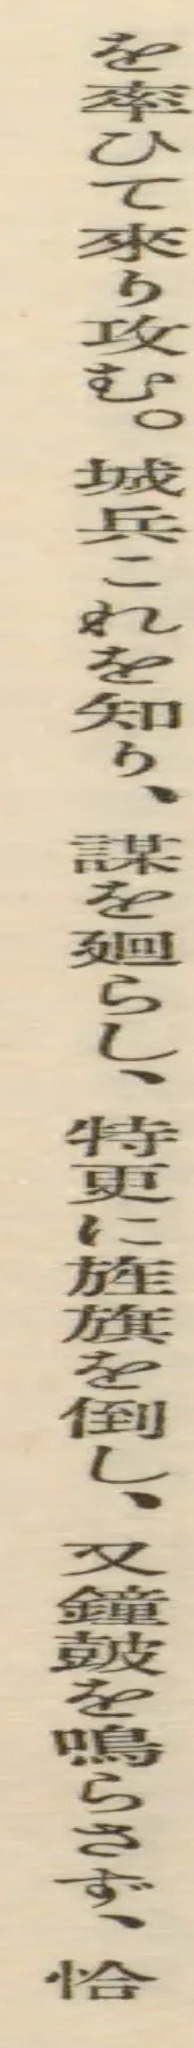を率ひて来り攻む。城兵これを知り、謀を廻らし、特更に旌籏を倒し、又鐘鼓を鳴らさず、恰
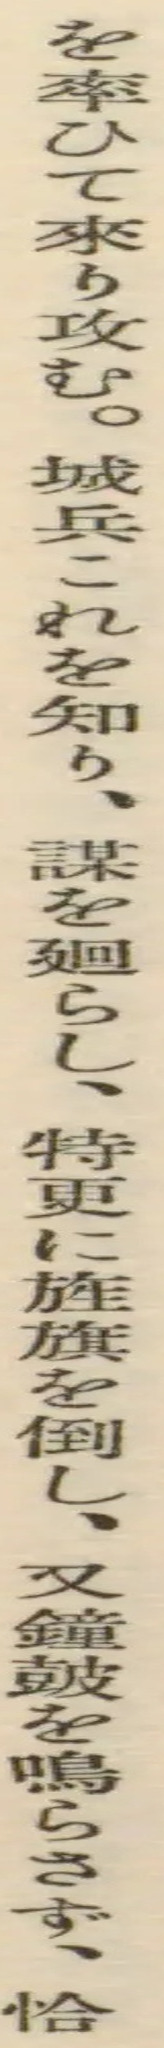を率ひて来り攻む。城兵これを知り、謀を廻らし、特更に旌籏を倒し、又鐘鼓を鳴らさず、恰
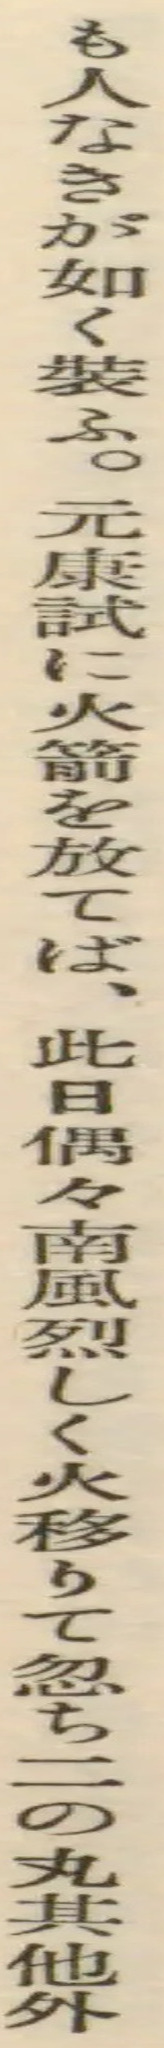も人なきが如く装ふ。元康試に火箭を放てば、此日偶々南風烈しく火移りて忽ち二の丸其他外
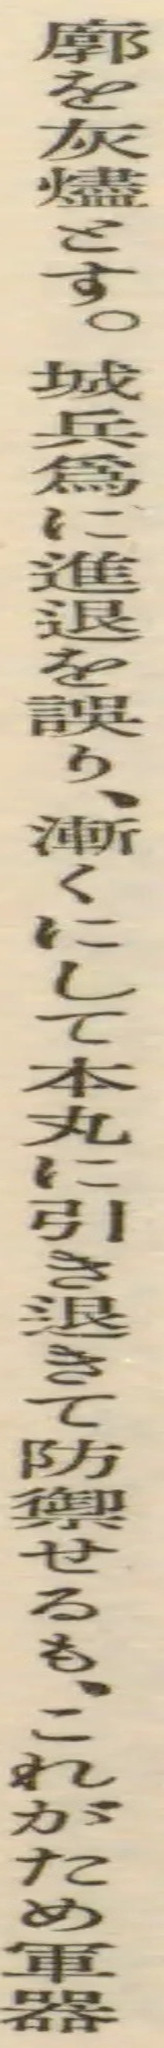廓を灰燼とす。城兵為に進退を誤り、漸くにして本丸に引き退きて防禦せるも、これがため軍器
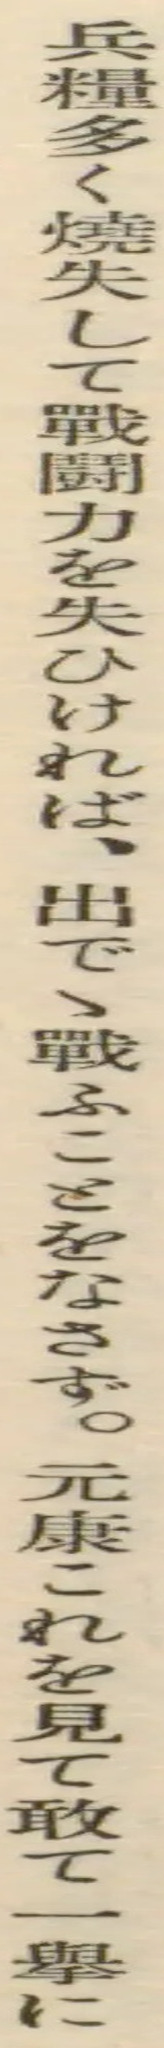兵糧多く焼失して戦闘力を失ひければ、出でゝ戦ふことをなさず。元康これを見て敢て一挙に
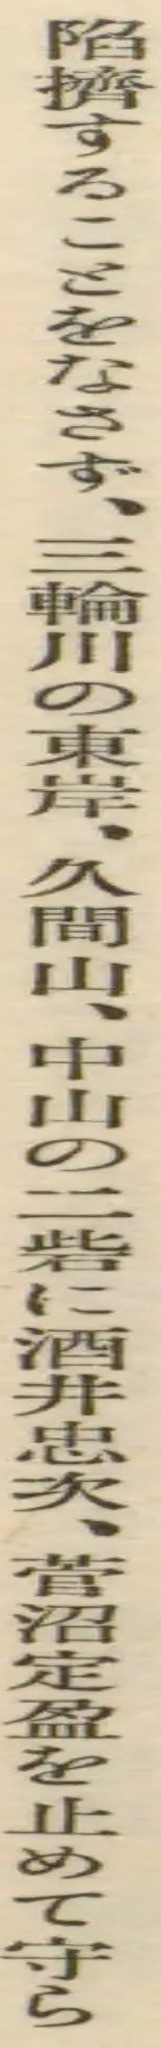陥擠することをなさず、三輪川の東岸、久間山、中山の二砦に酒井忠次、菅沼定盈を止めて守ら
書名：東三河之古城
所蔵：国立国会図書館 National Diet Library, JAPAN
